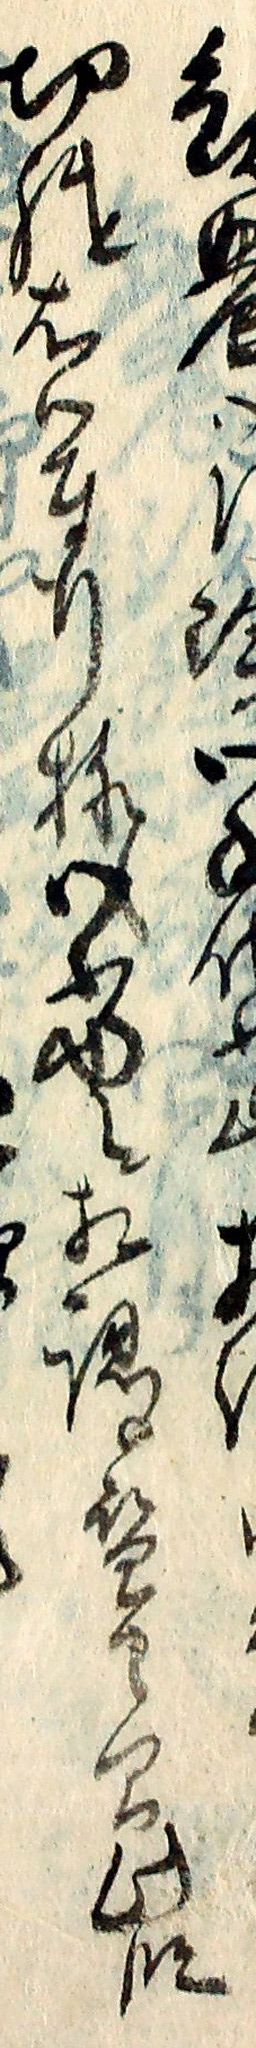切継右御奉行様へ御当に相認め替申候間此段
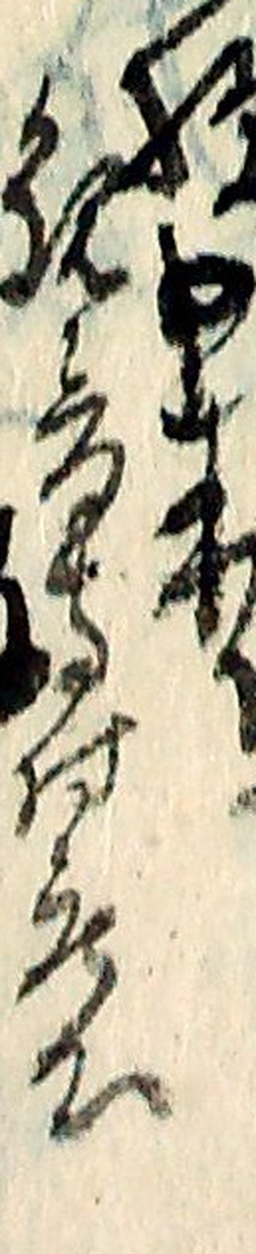観音寺村庄屋
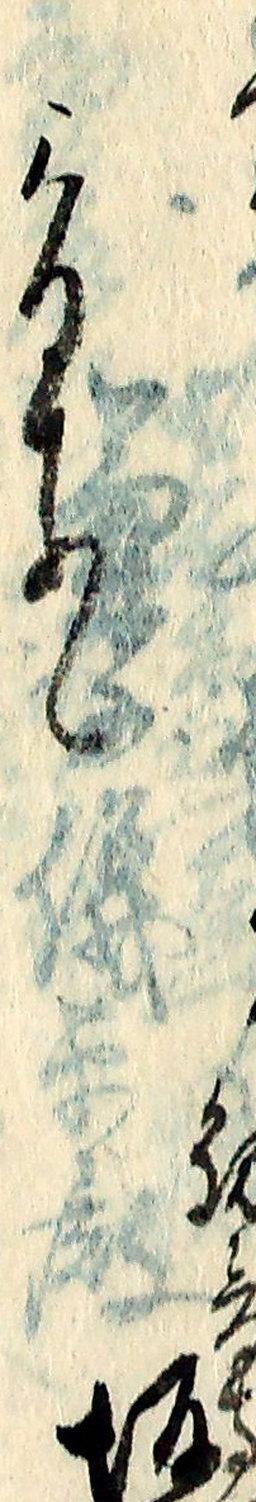三月十五日
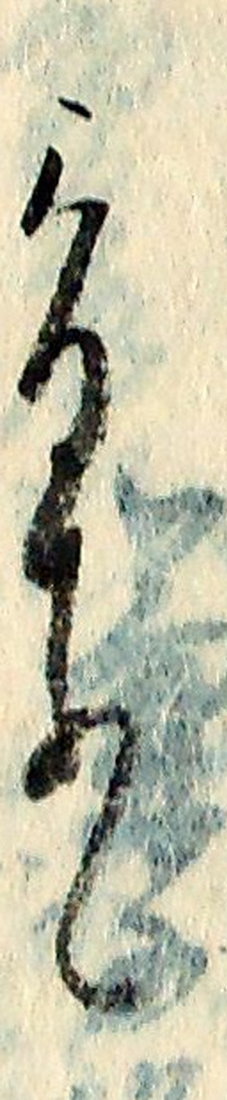三月十五日
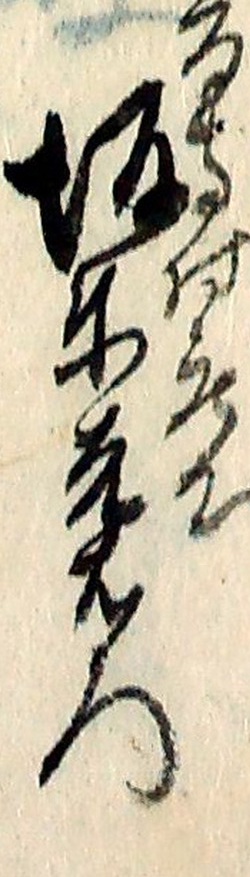坂東吉右衛門
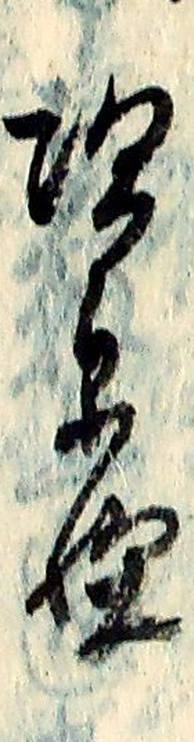次兵衛様
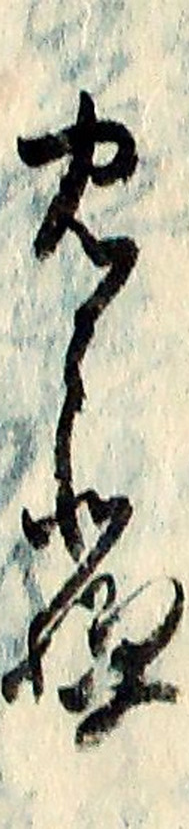忠兵衛様
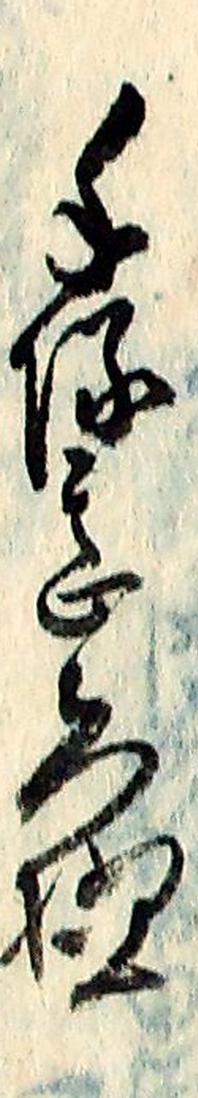手塚甚右衛門様
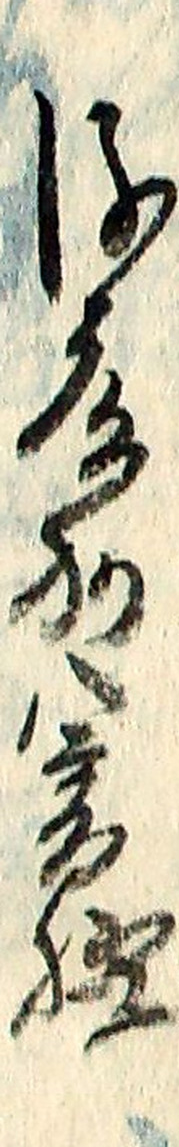後藤利八郎様
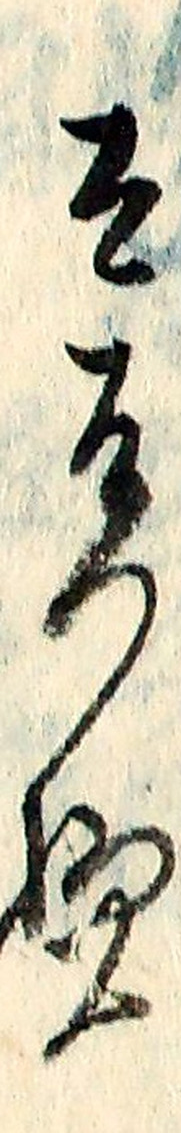太左衛門様
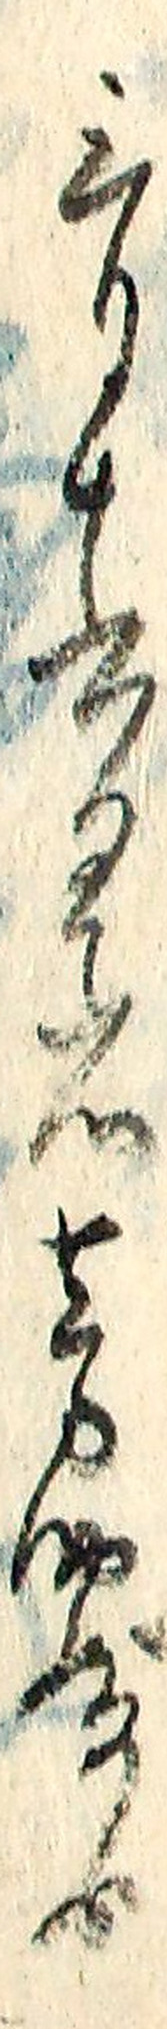三月十六日着芳助殿ゟ

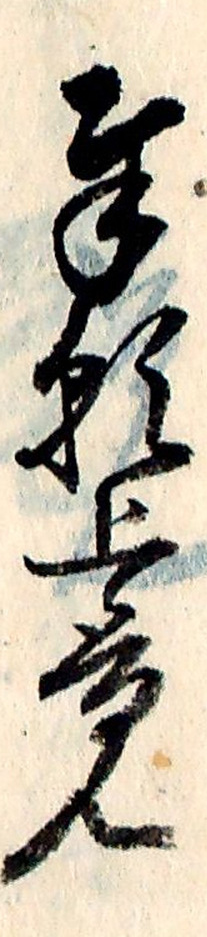奉願上覚
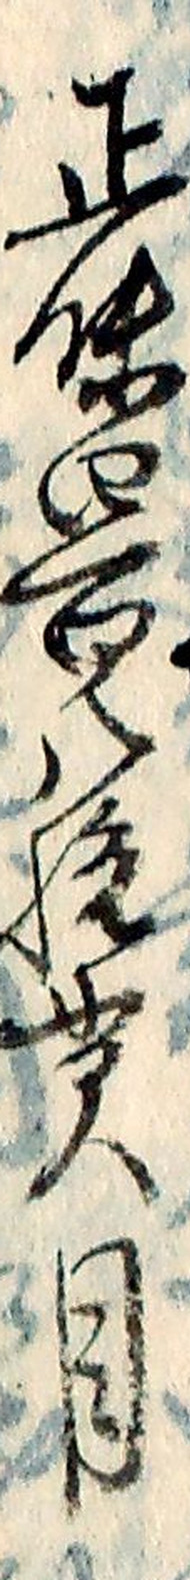正味四百八拾貫目
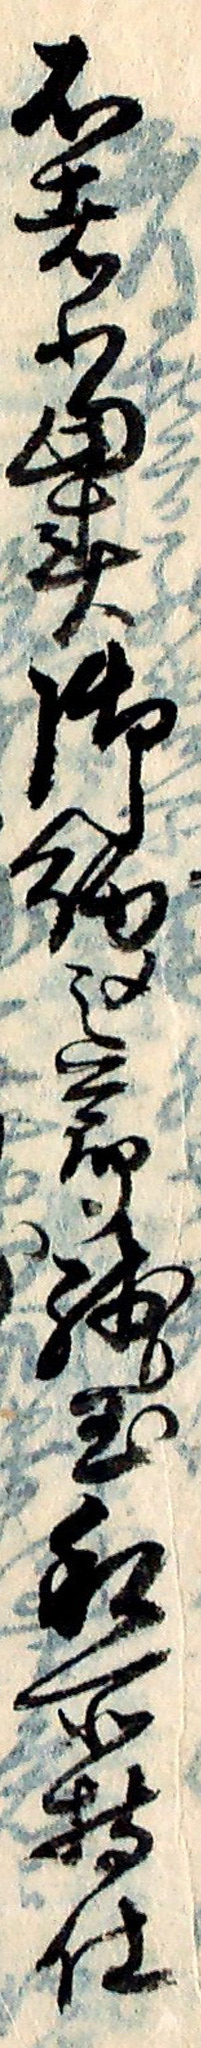右は当春御約め之節残り玉私所持仕
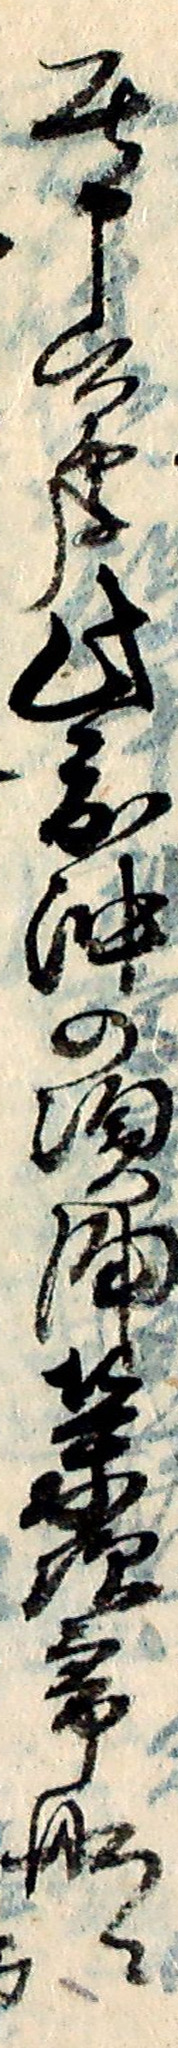居申候処此度沖の須浦葉次三郎船て
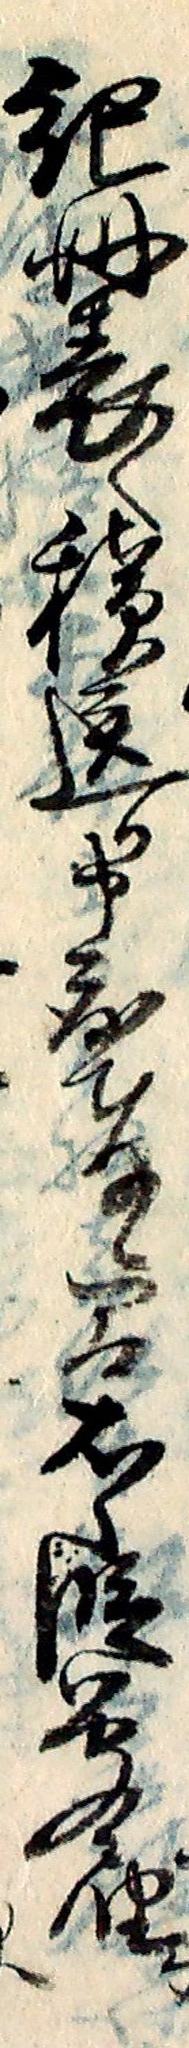紀州表へ積送り申度奉存候間右之段御聞届け
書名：諸御願書控(後藤氏壱番）
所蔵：鳴門教育大学 Naruto University of Education
